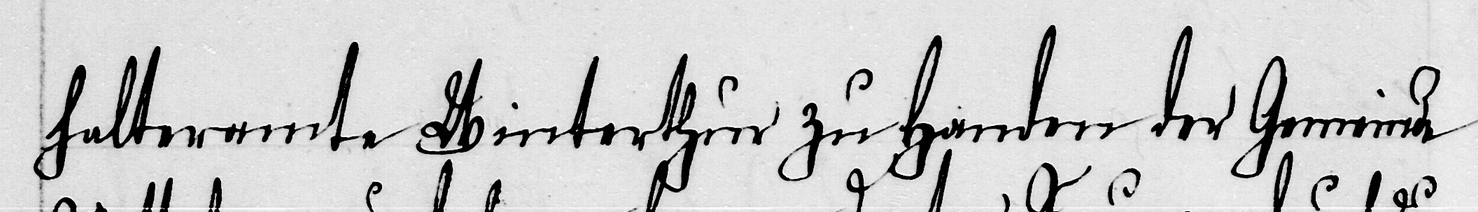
halteramte Winterthur zu Handen der Gemeinde
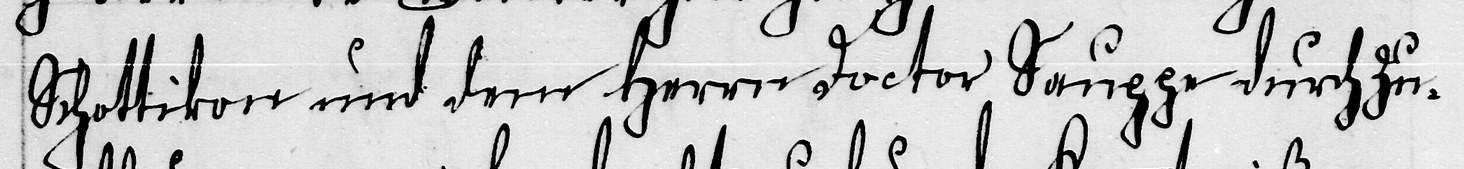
Schottikon und dem Herrn Doctor Sauppe durch Zu¬
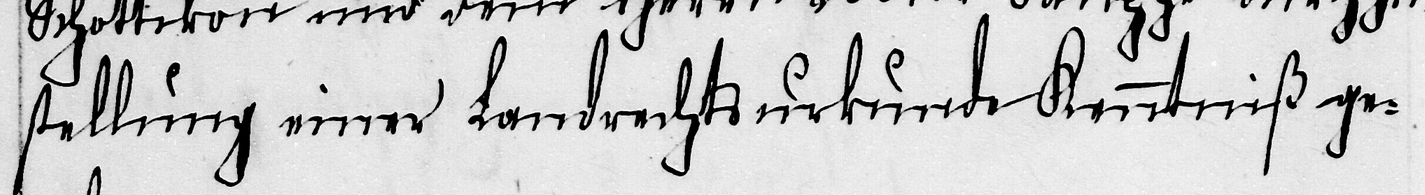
stellung einer Landrechtsurkunde Kenntniß ge¬
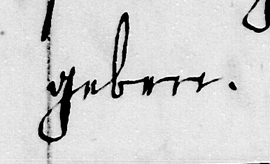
geben.
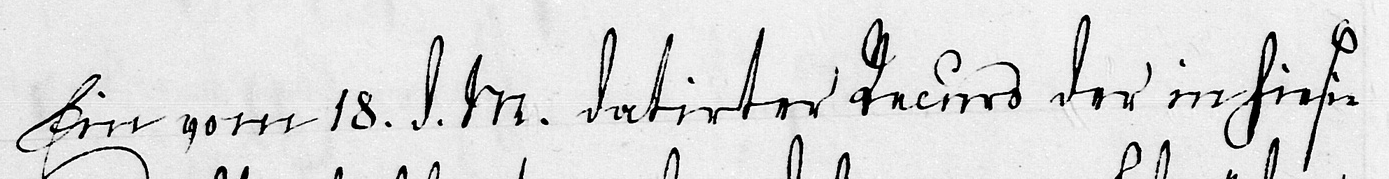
Ein vom 18. d. M. datirter Recurs der in hiesi¬
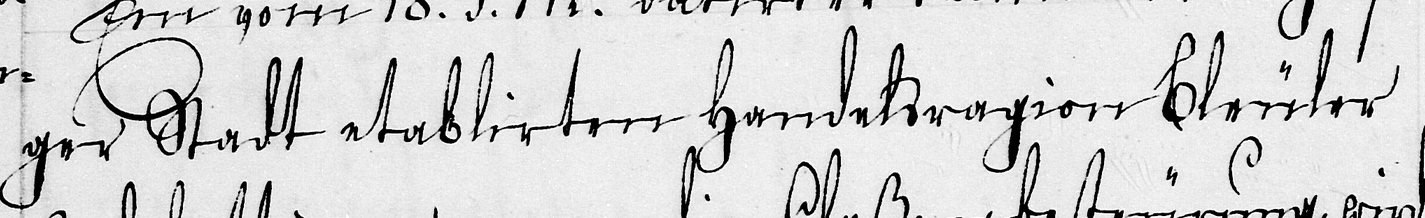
ger Stadt etablirten Handelsragion Bleuler
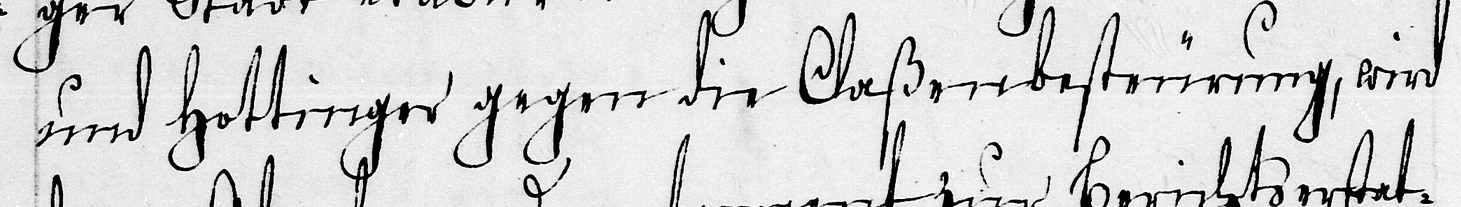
und Hottinger gegen die Claßenbesteuerung, wird
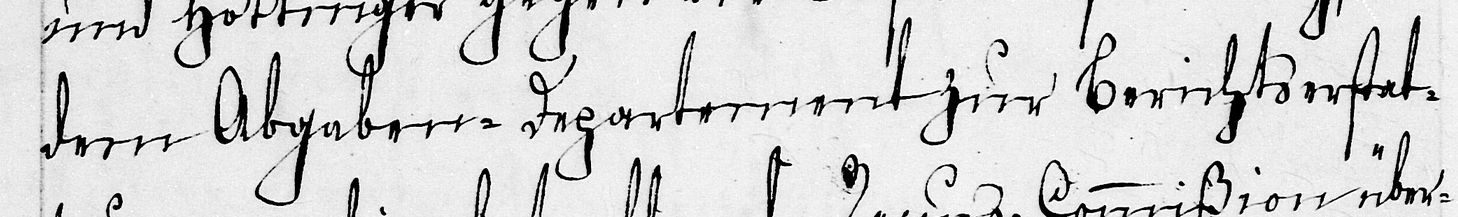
dem Abgaben-Departement zur Berichtserstat¬
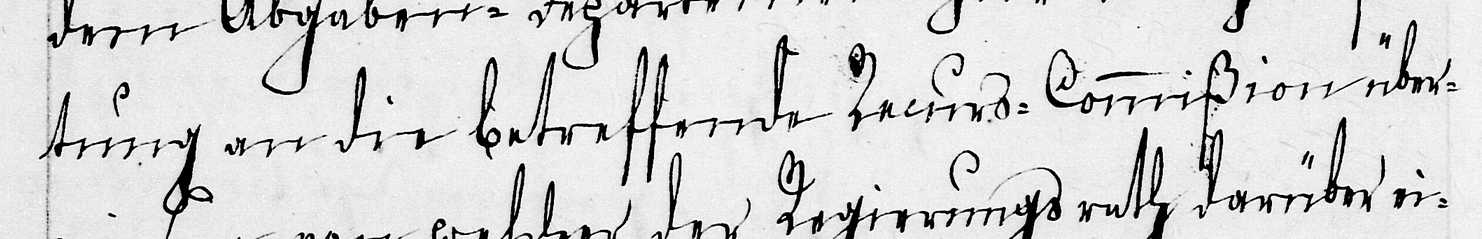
tung an die betreffende Recurs-Commißion über¬
